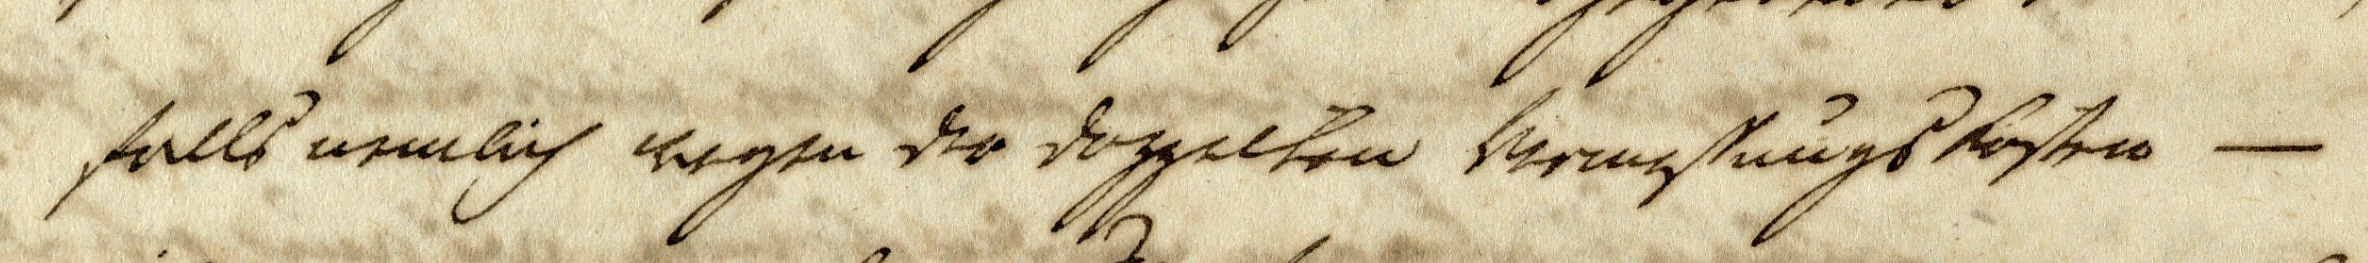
falls nemlich wegen der doppelten Vermessungskosten
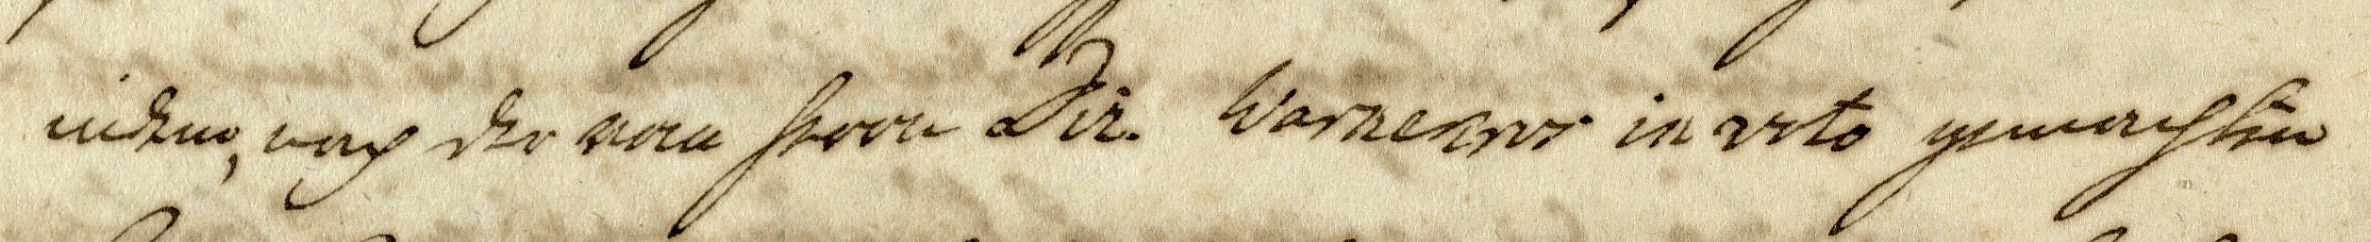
indem, nach der vom Herrn Dir. Warnekros in voto gemachten
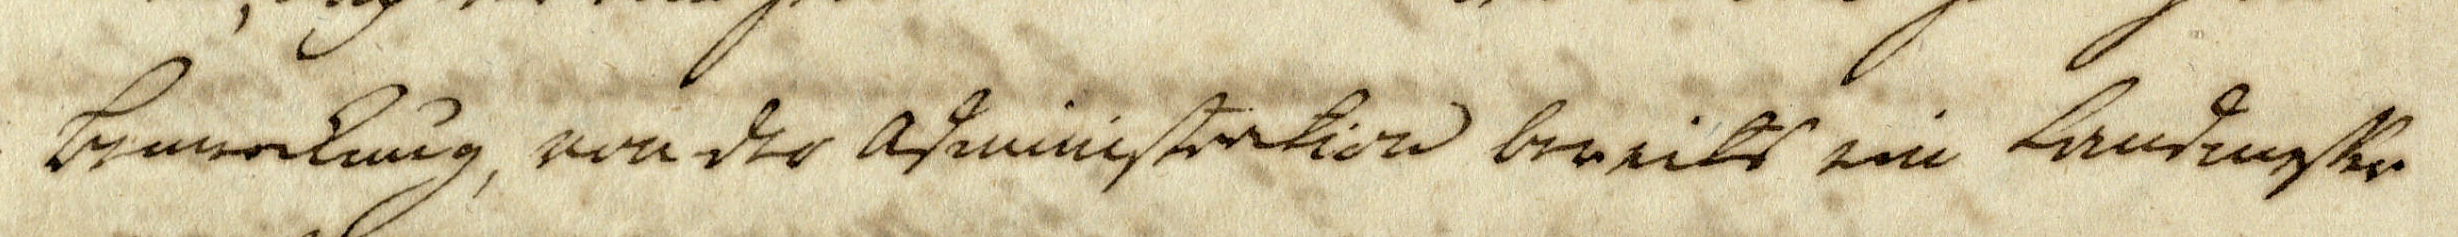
Bemerckung, von der Administration bereits ein Landmesser
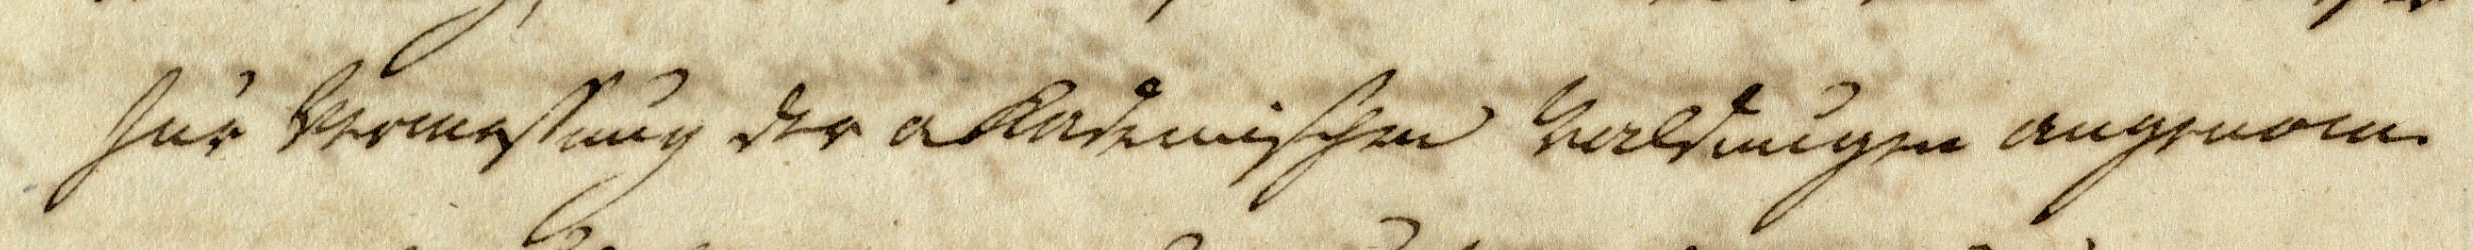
zur Vermessung der akademischen Waldungen angenom¬
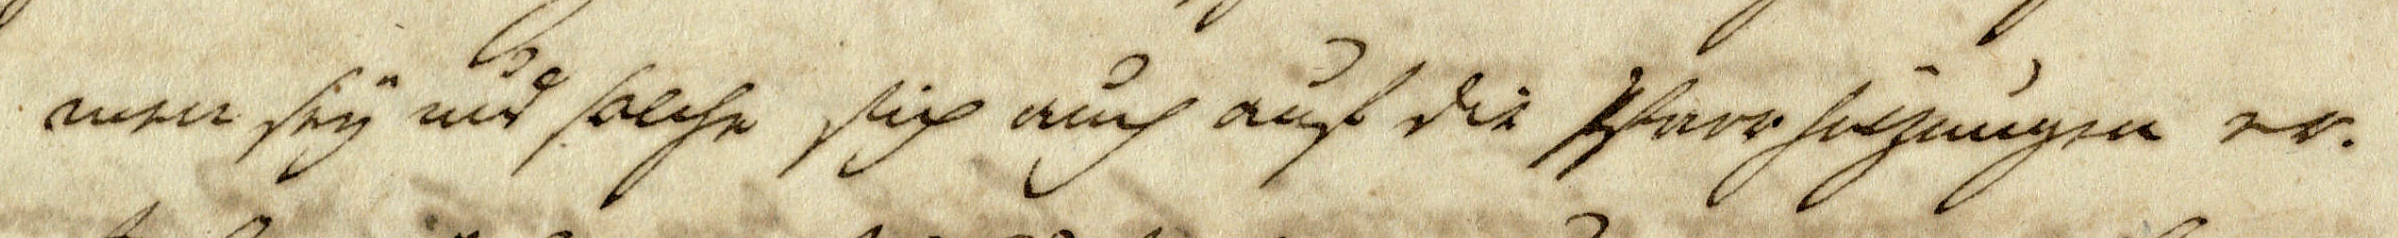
men seÿ und solche sich auch auf die Pfarrhölzungen er¬
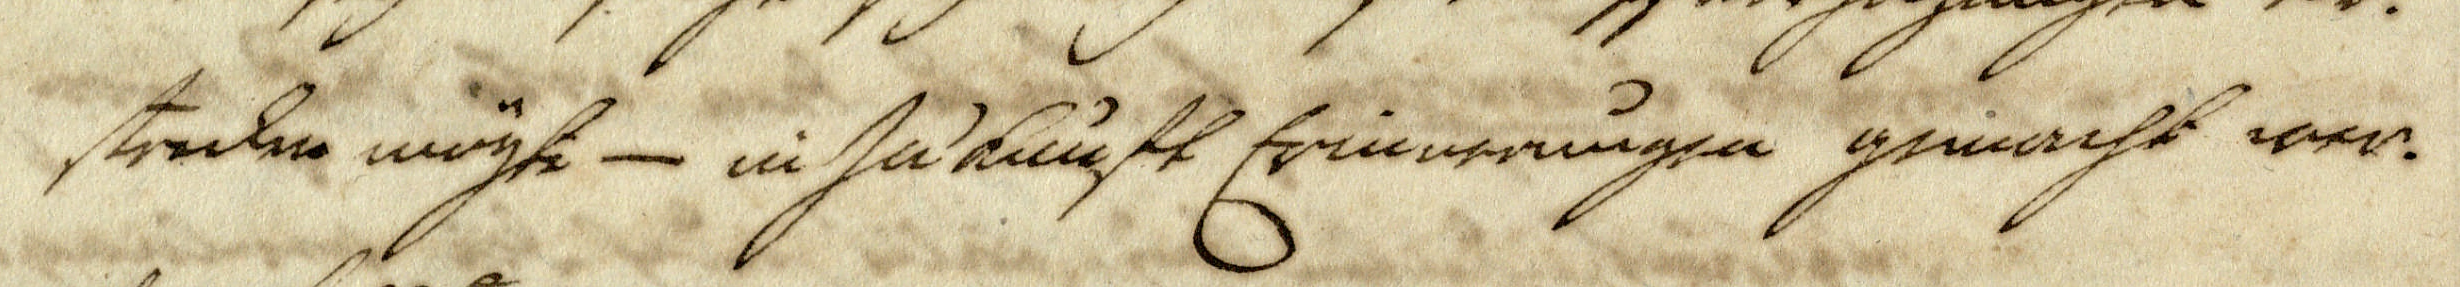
strecken , in Zukunft Erinnerungen gemacht wer¬
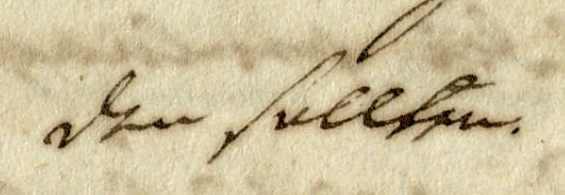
den sollten.
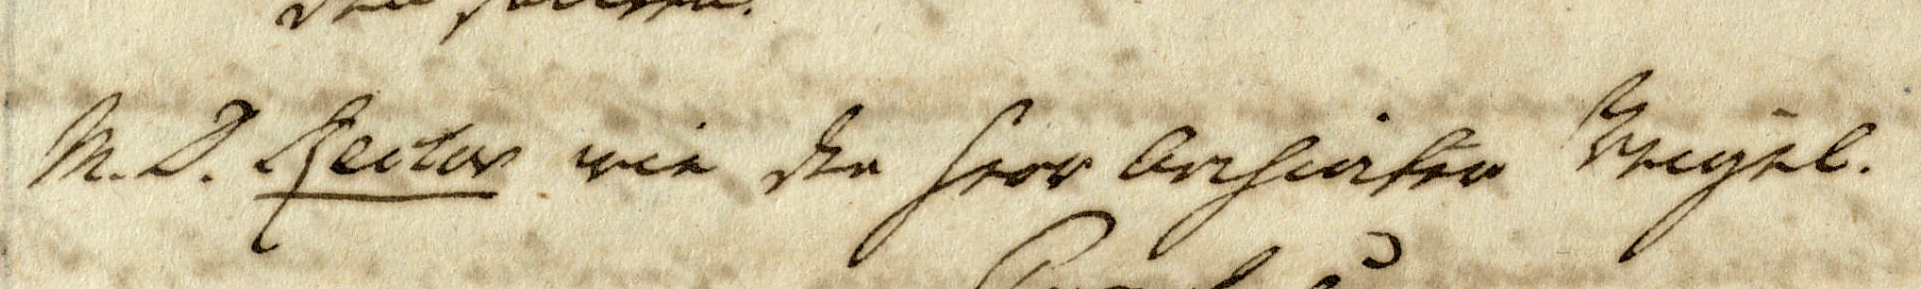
M. D. Rector wie der Herr Archiater Weigel.
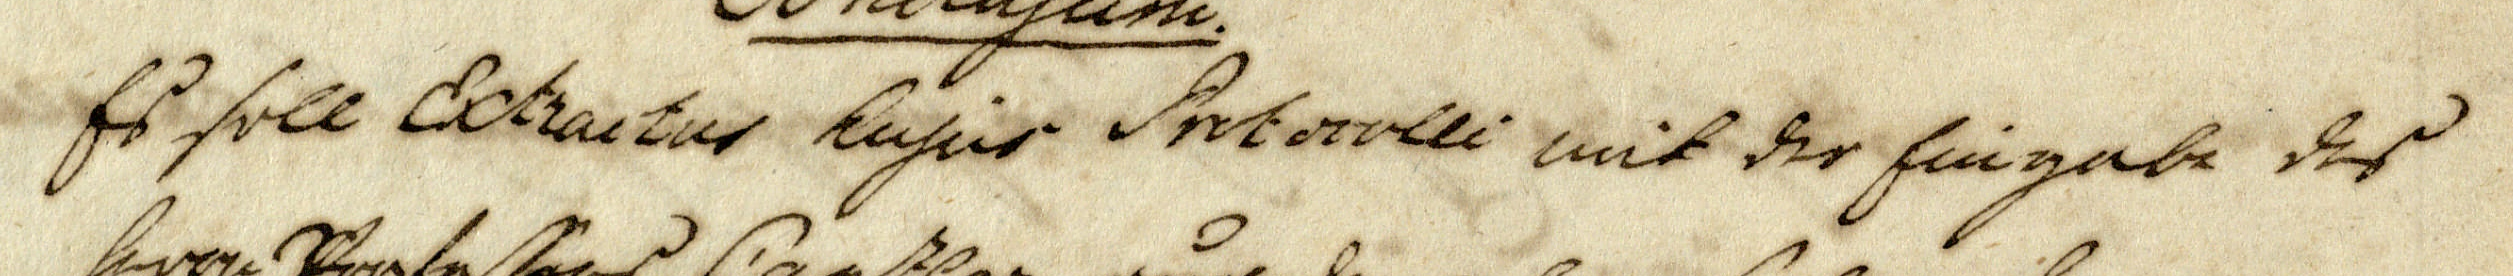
Es soll Extractus hujus Protocolli mit der Eingabe des
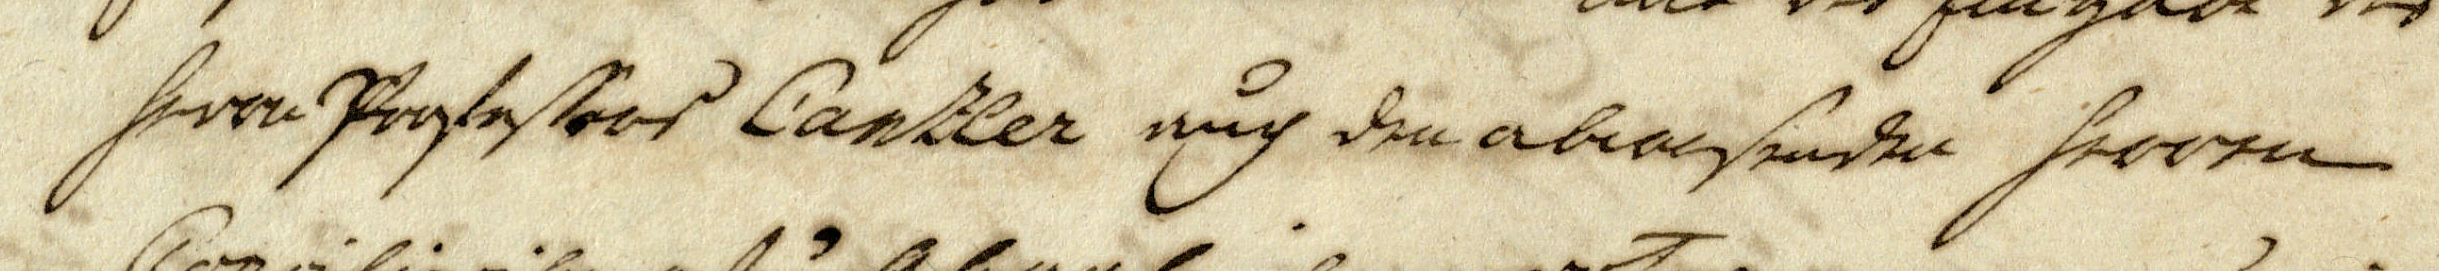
Herrn Professors Canzler auch den abwesenden Herren
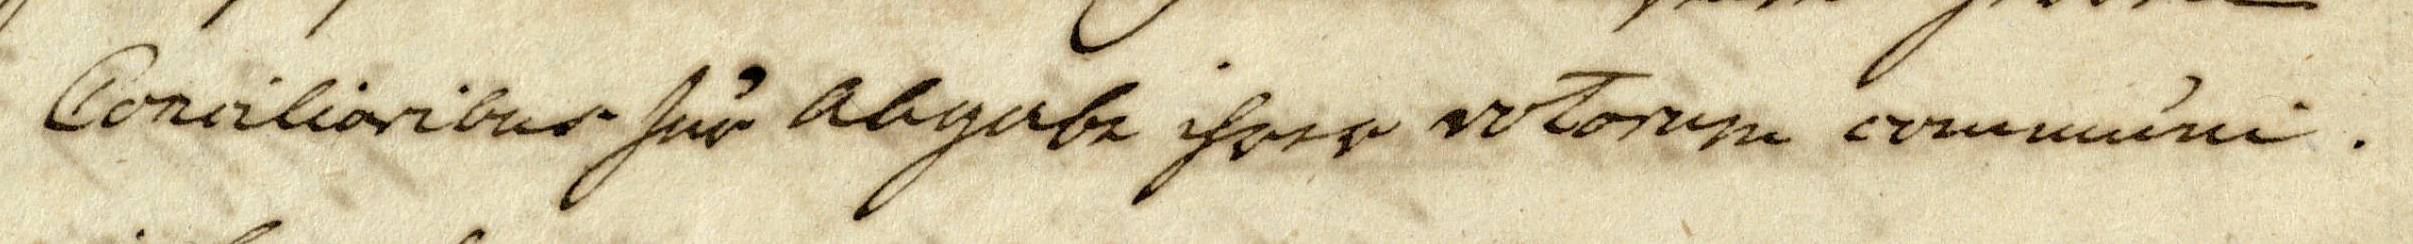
Conciliaribus zur Abgabe ihrer votorum communi¬
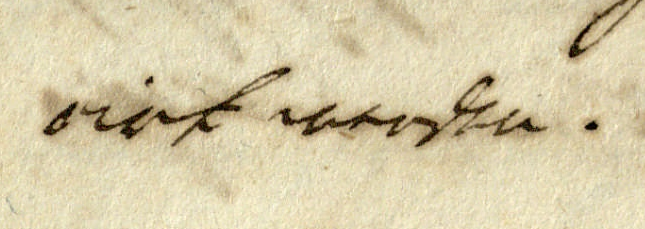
cirt werden.
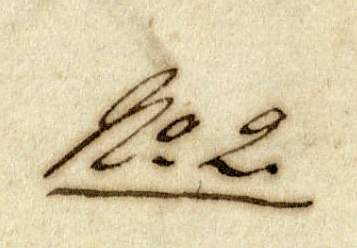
No 2.
